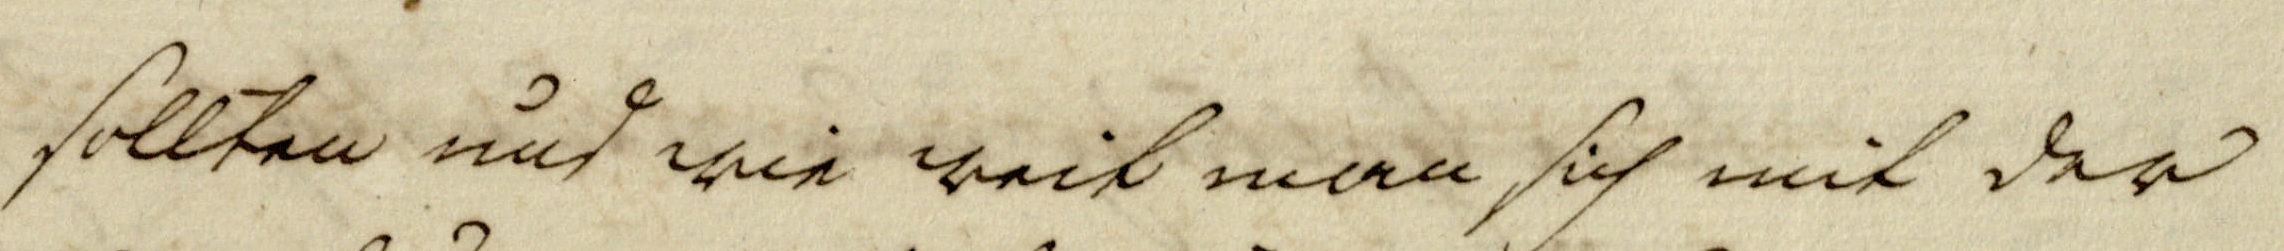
sollten und wie weit man sich mit der
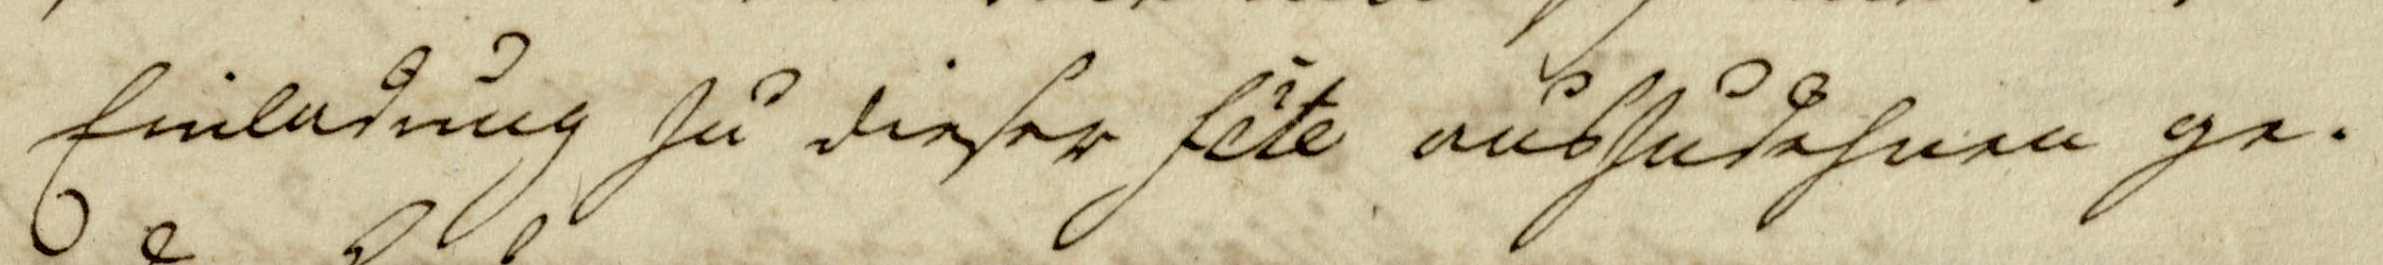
Einladung zu dieser feite auszudehnen ge¬
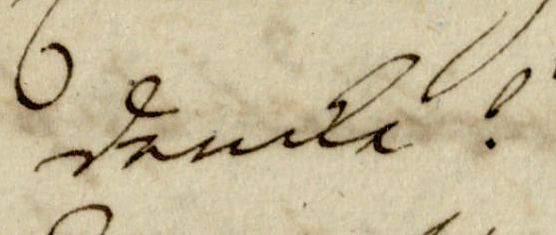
dencke?
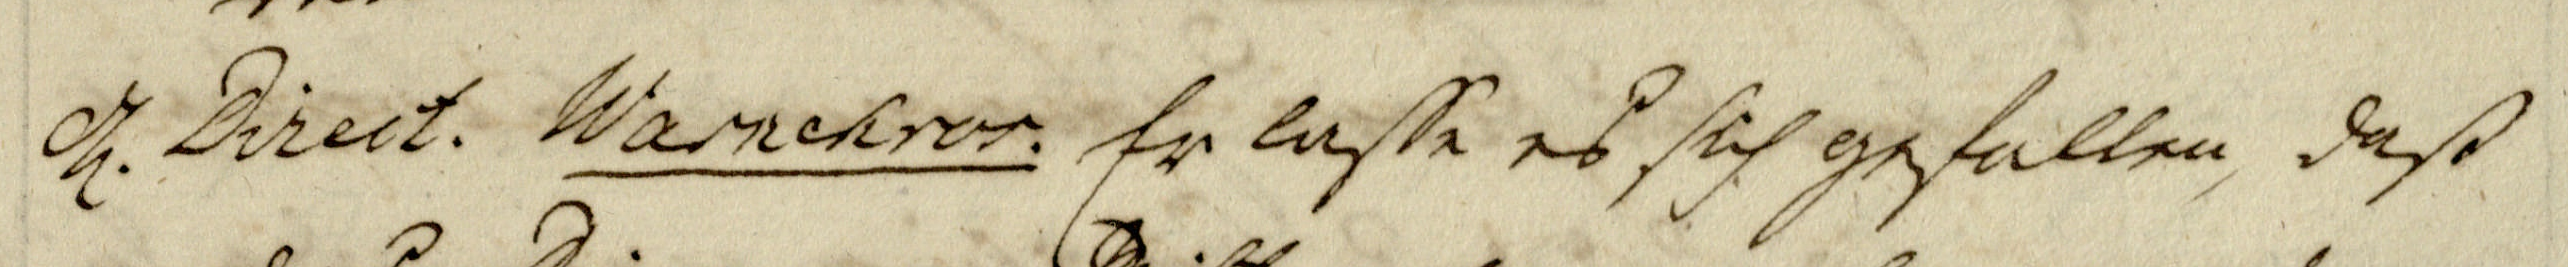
dh. Direct. Warnekros. Er lasse es sich gefallen daß
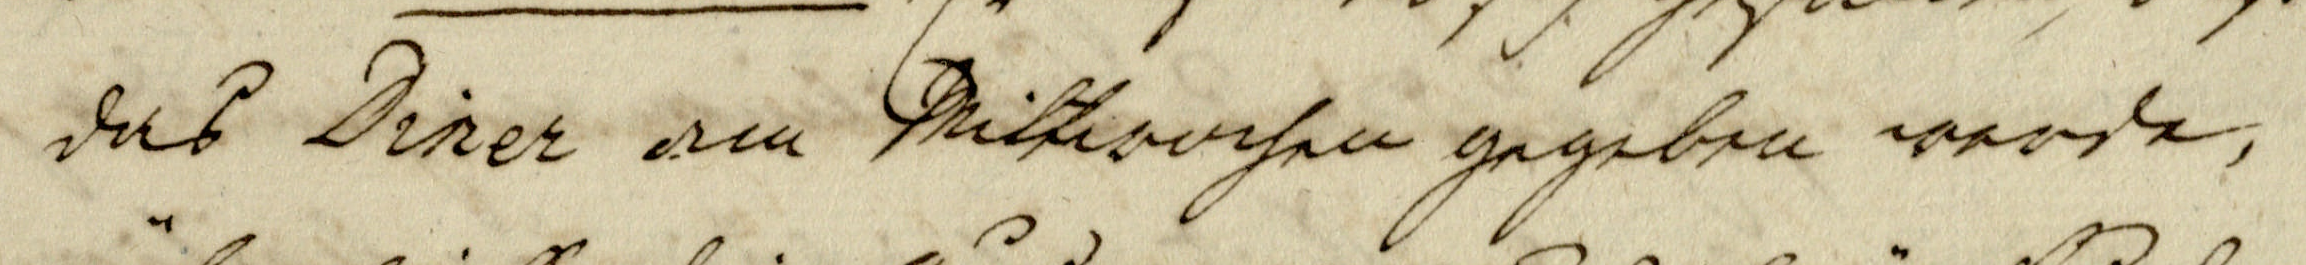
das Diner am Mittwochen gegeben werde,
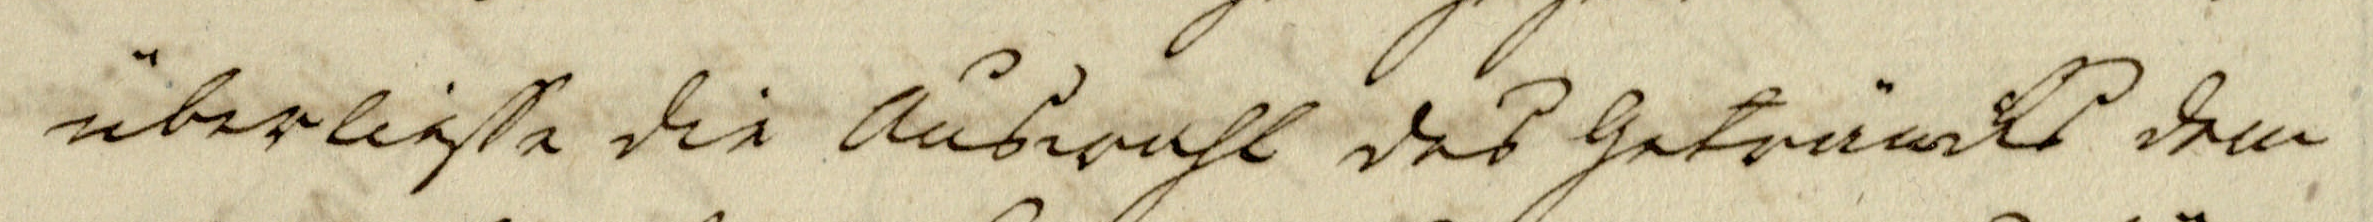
überliesse die Auswahl des Geträncks dem
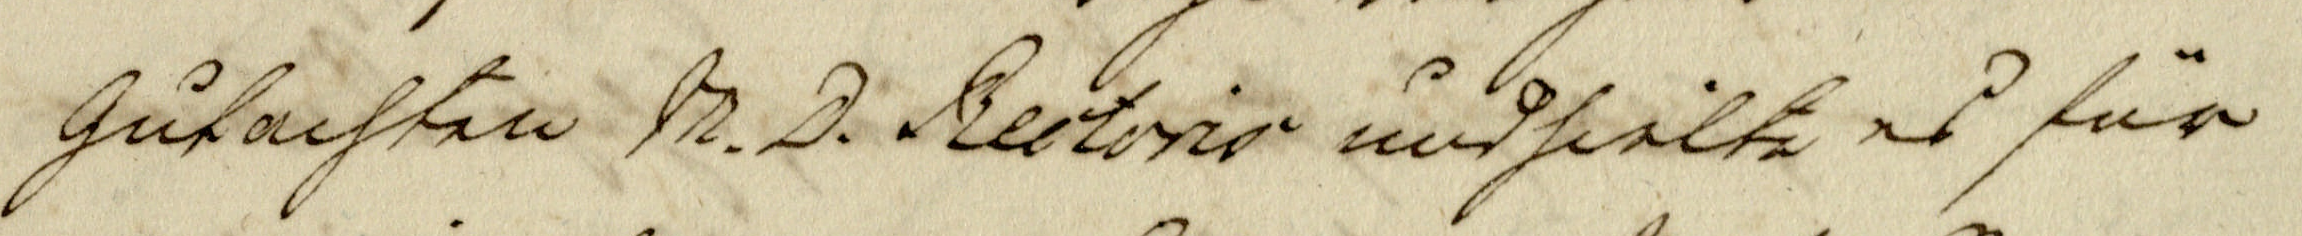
Gutachten M. D. Rectoris und hielte es für
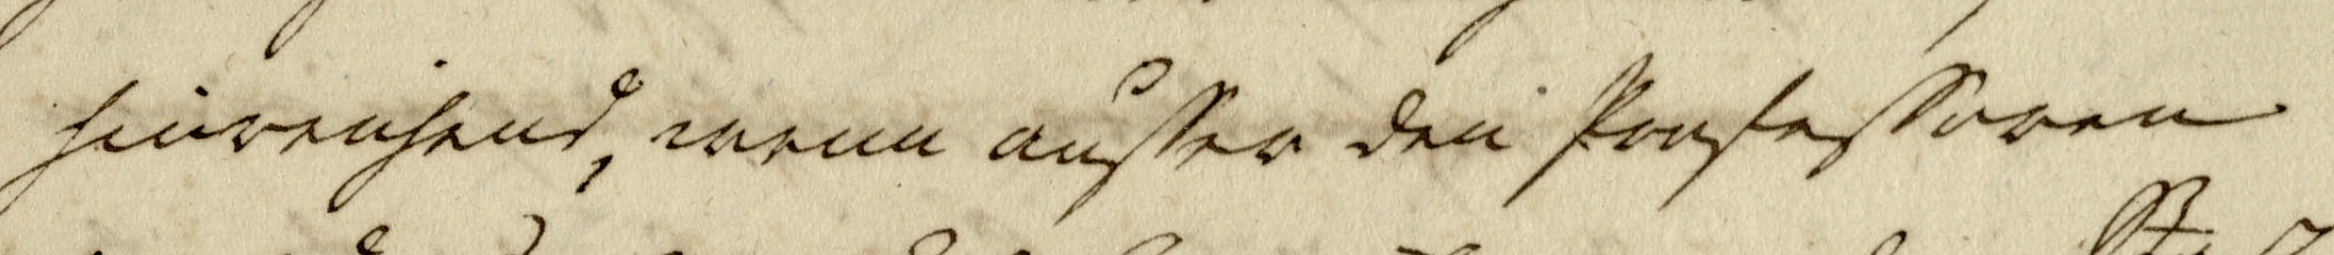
hinreichend, wenn ausser den Professoren
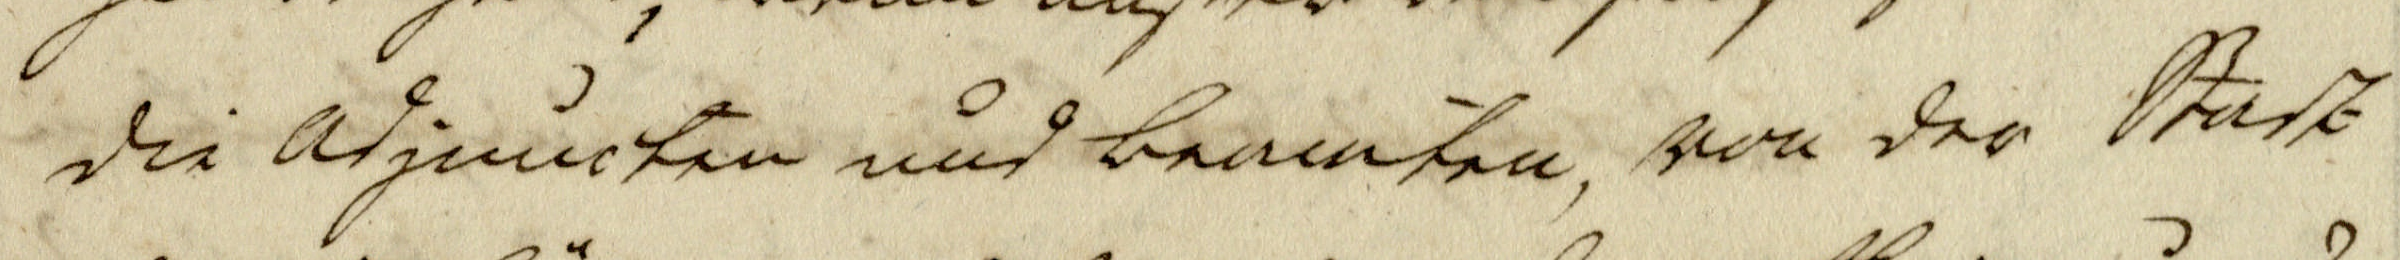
die Adjuncten und Beamten, von der Stadt
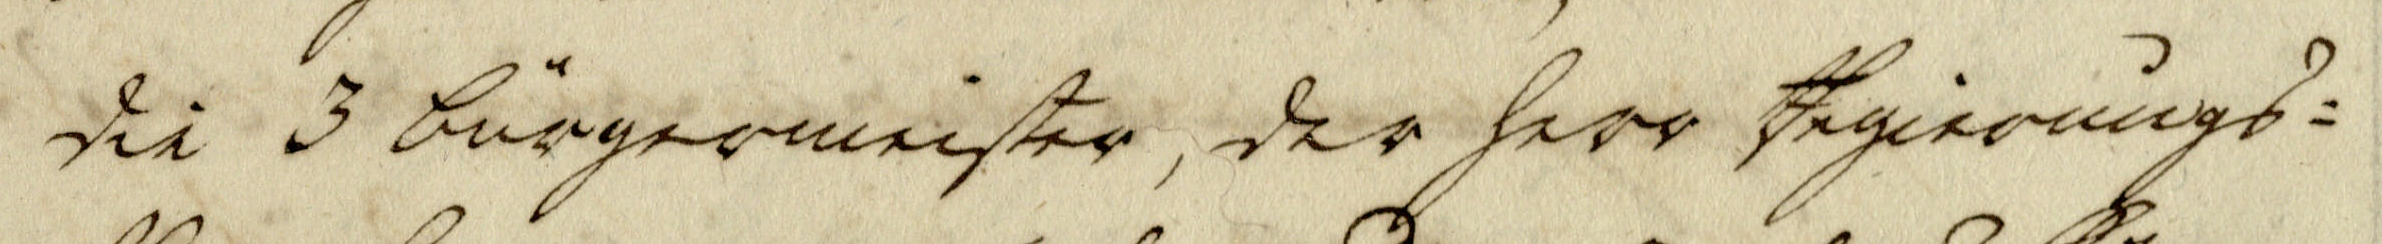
die 3 Bürgermeister, der Herr Regierungs¬
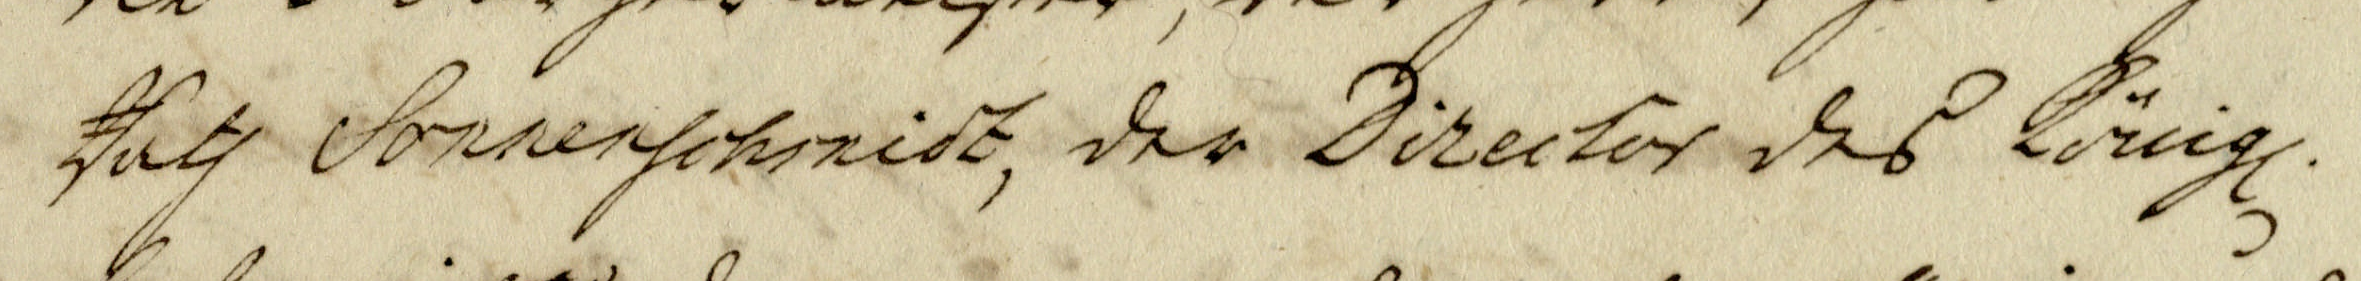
Rath Sonnenschmidt, der Director des Königl.
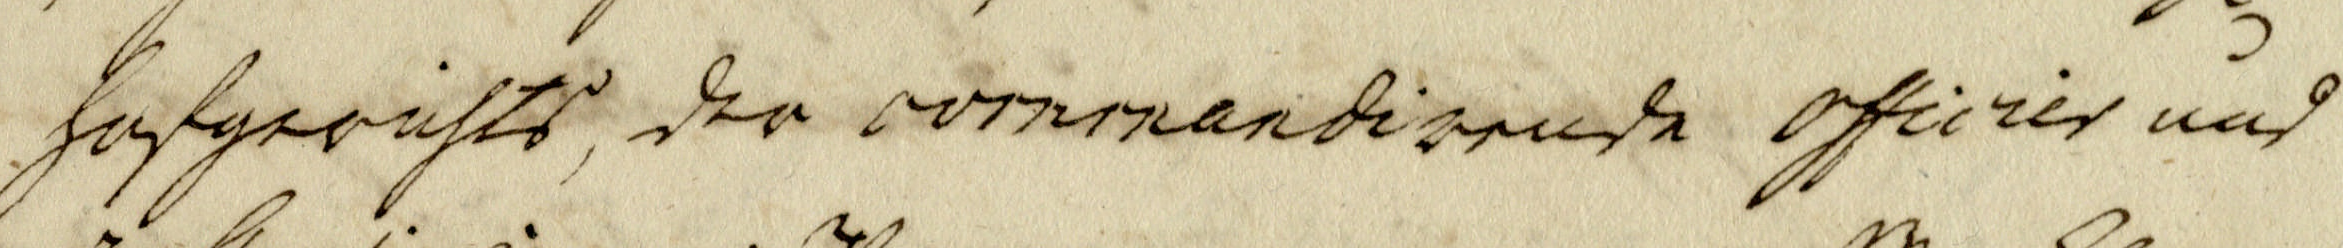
Hofgerichts, der commandirende Officier und
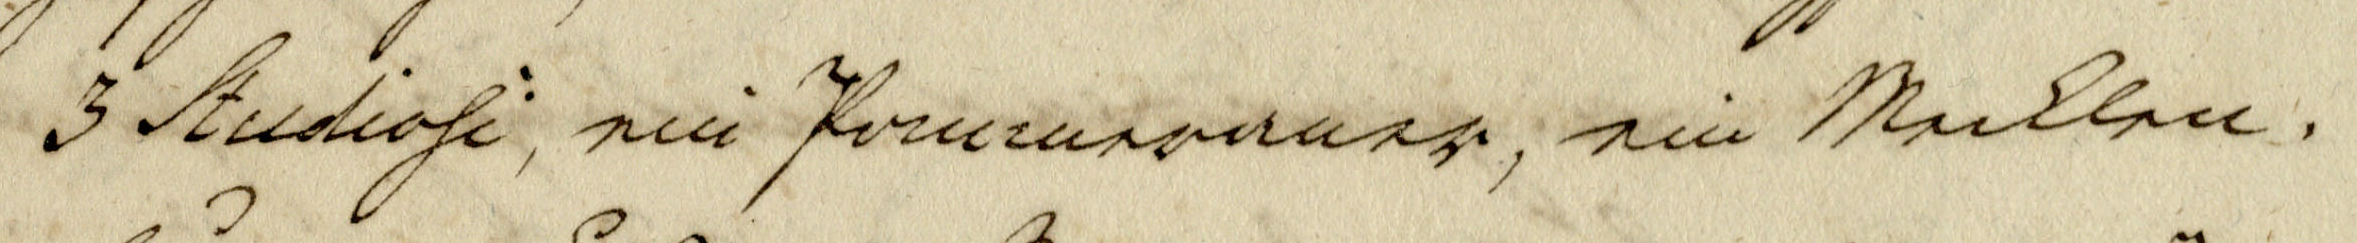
3 Studiosi, ein Pommeraner, ein Mecklen¬
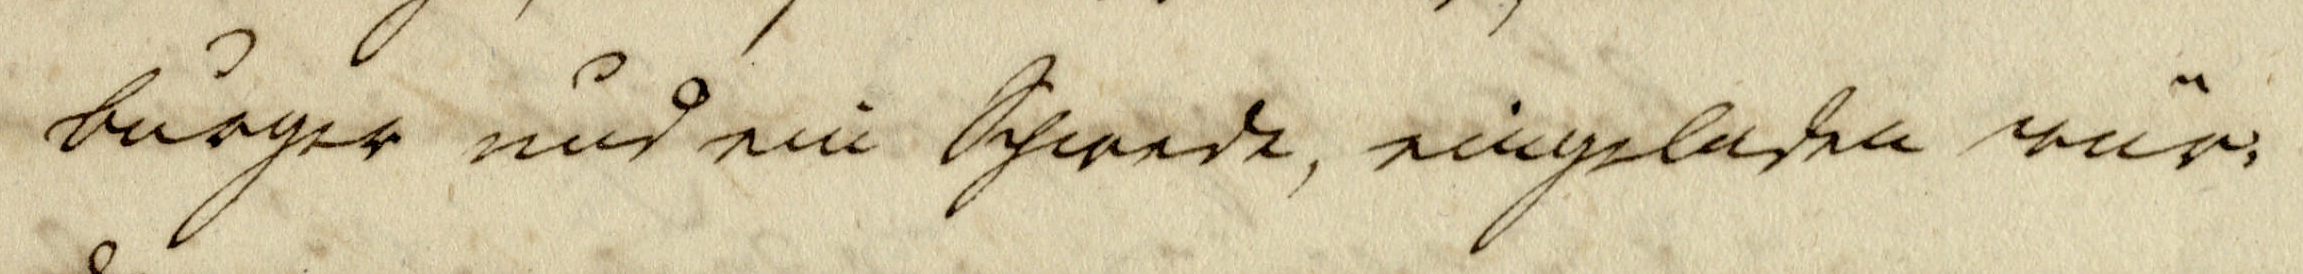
burger und ein Schwede, eingeladen wür¬
